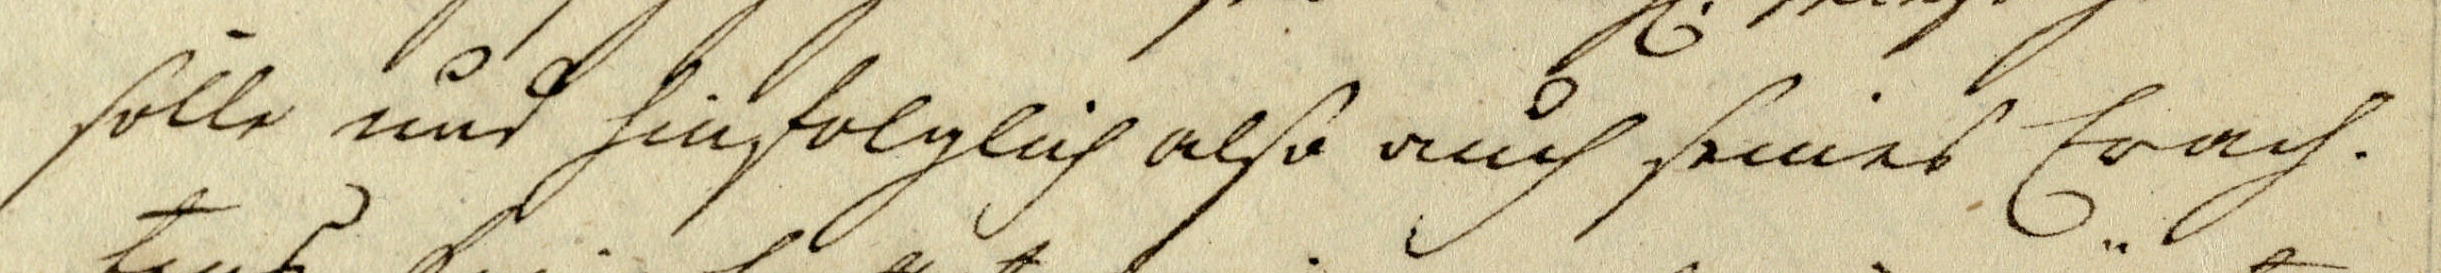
solle und hinfolglich also auch seines Erach¬
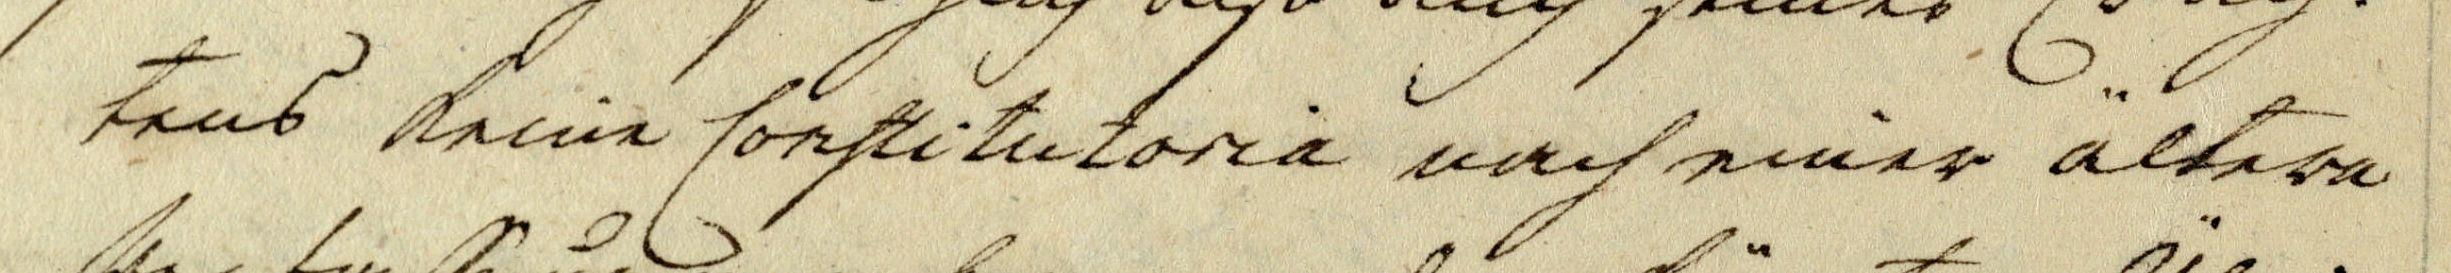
tens keine Constitutoria nach einer ältern
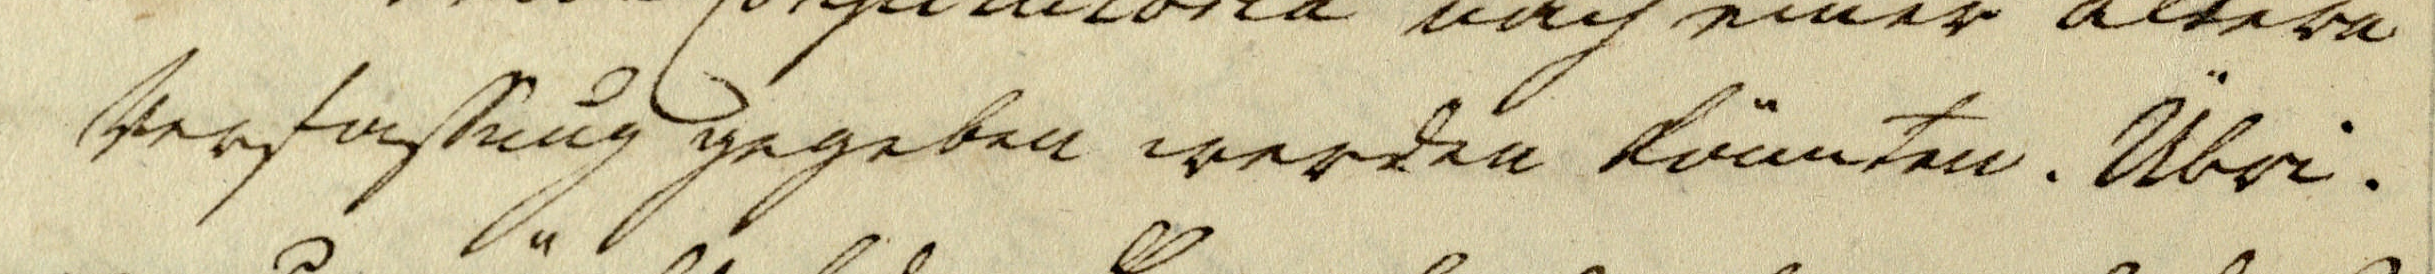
Verfassung gegeben werden könnten. Übri¬
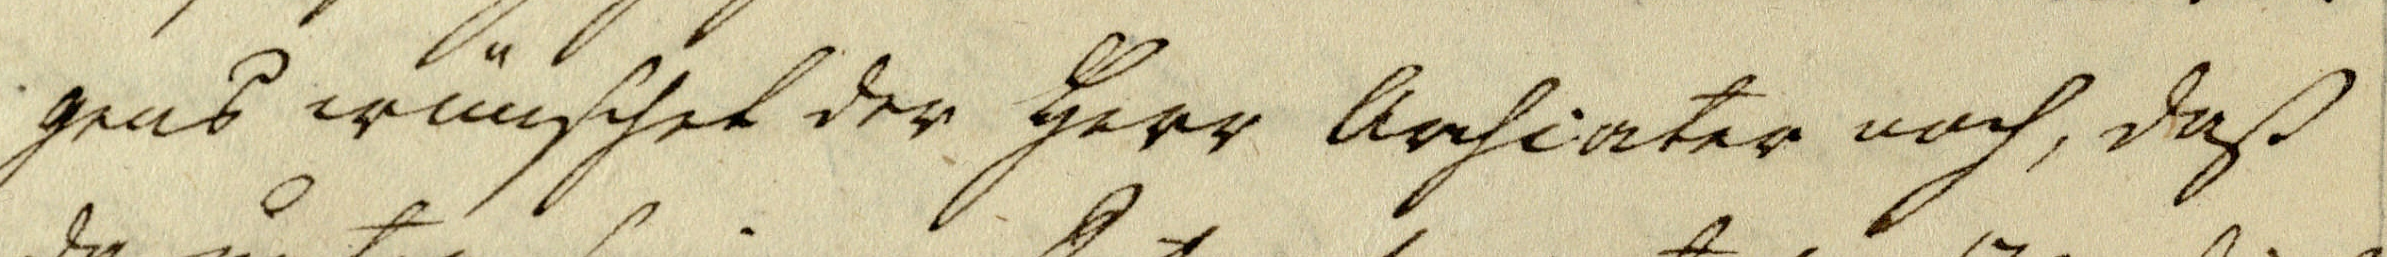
gens wünsche der Herr Archiater noch, daß
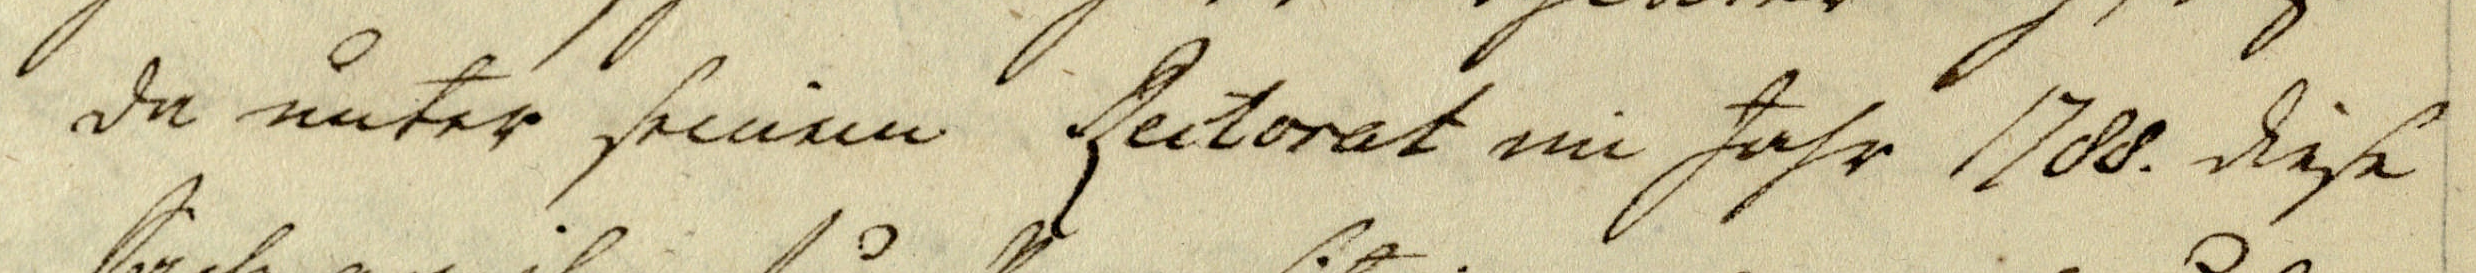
da unter seinem Rectorat im Jahr 1788. diese
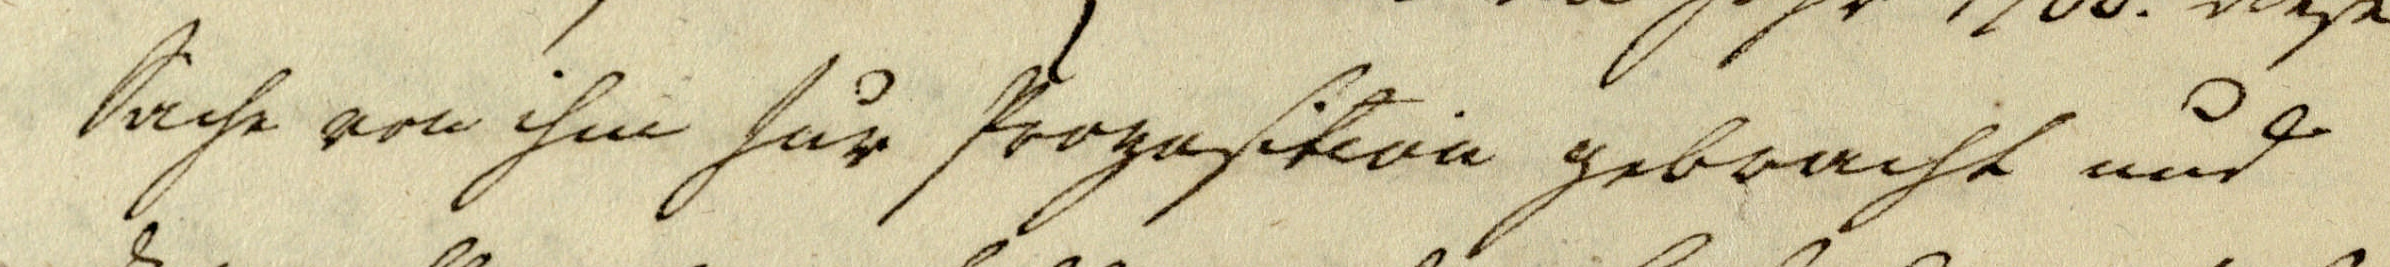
Sache von ihm zur Proposition gebracht und
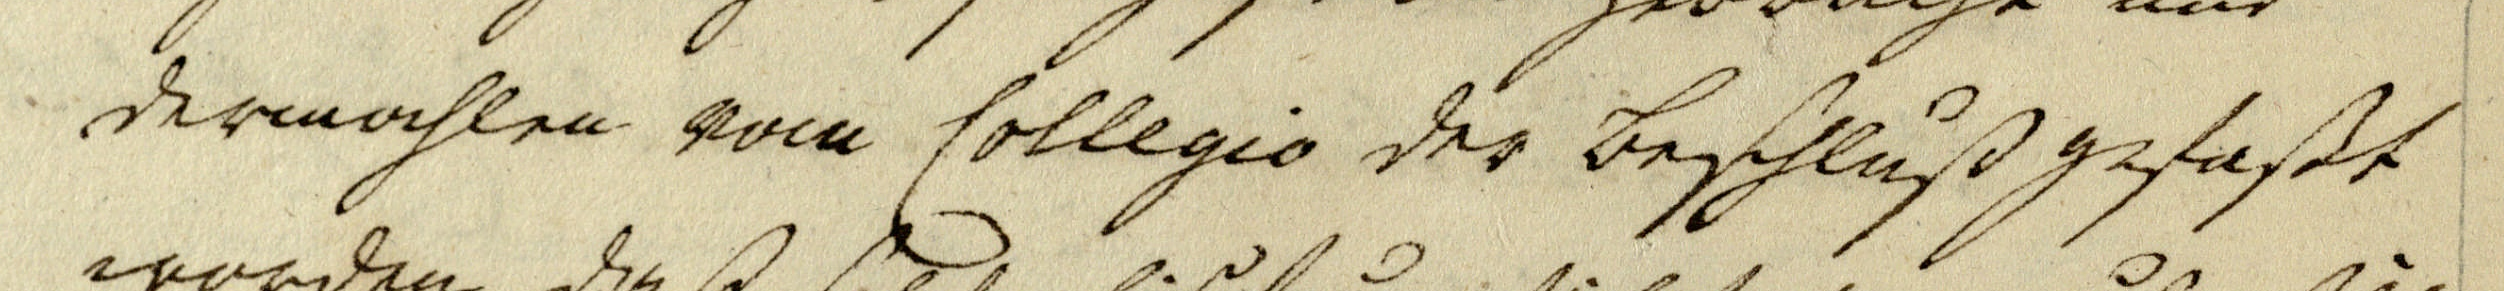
dermahlen vom Collegio der Beschluß gefaßt
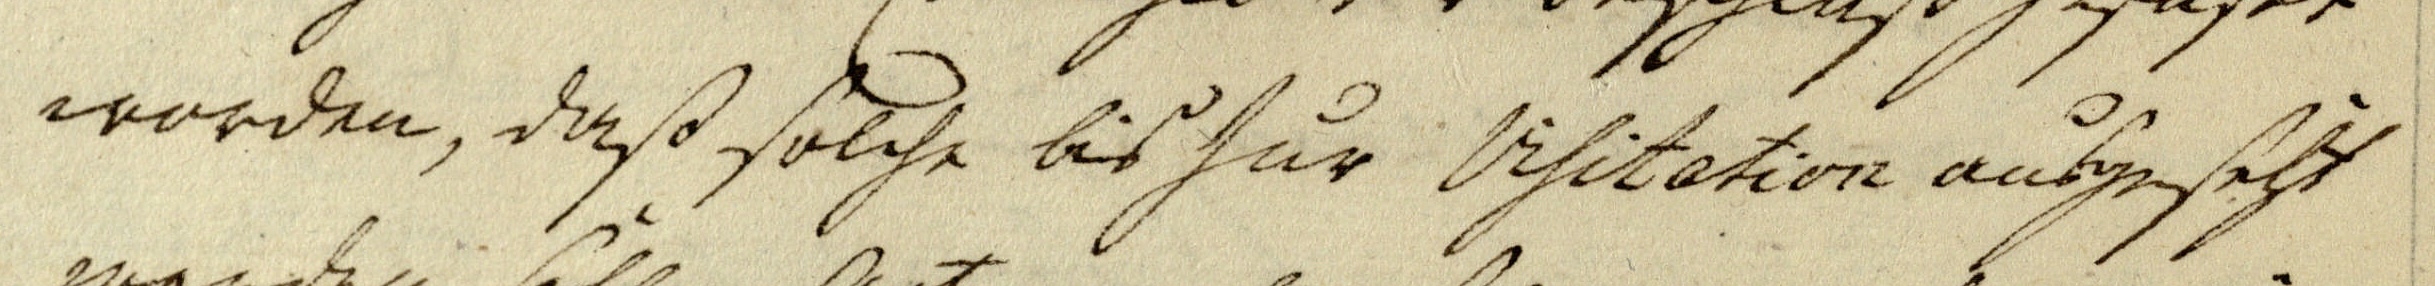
worden, daß solche bis zur Visitation ausgesetzt
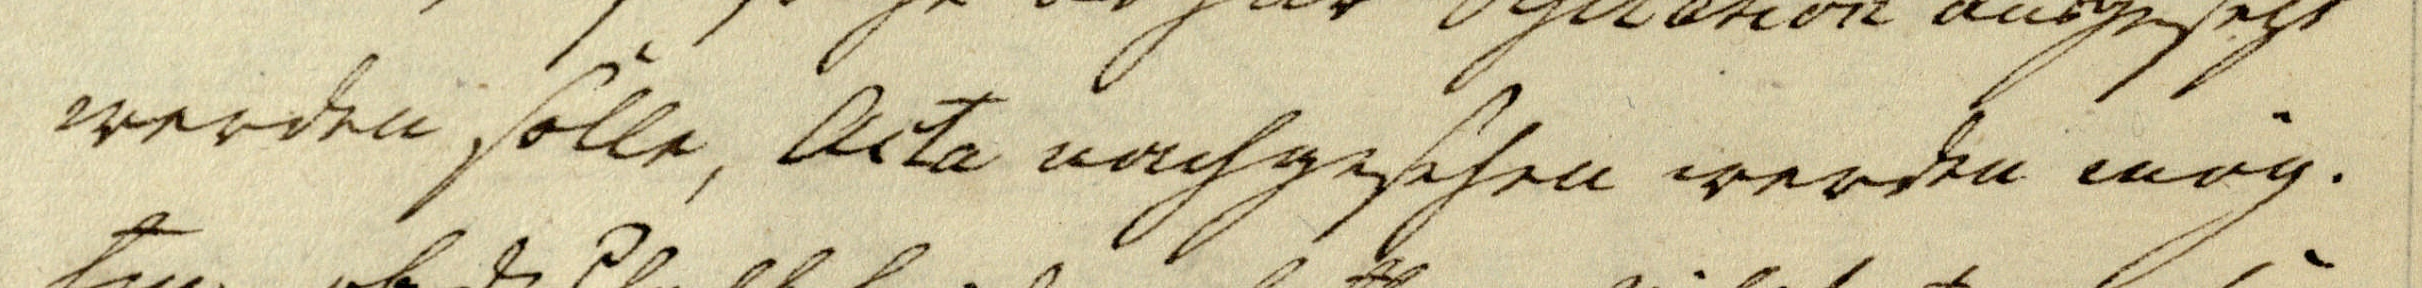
werden solle, Acta nachgesehen werden mög¬
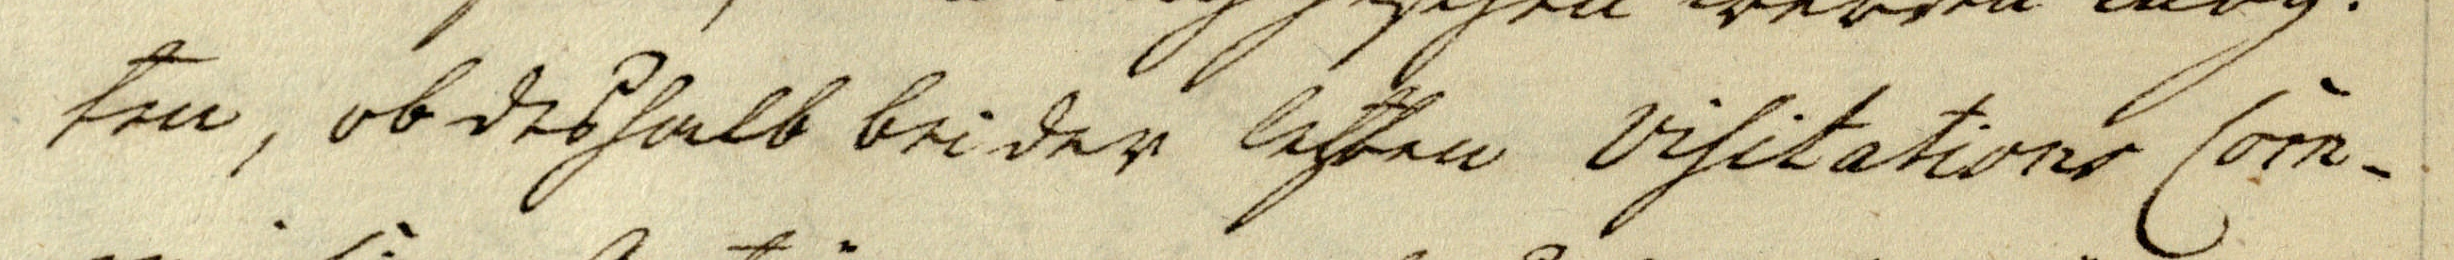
ten, ob deshalb bei der letzten Visitations Com¬
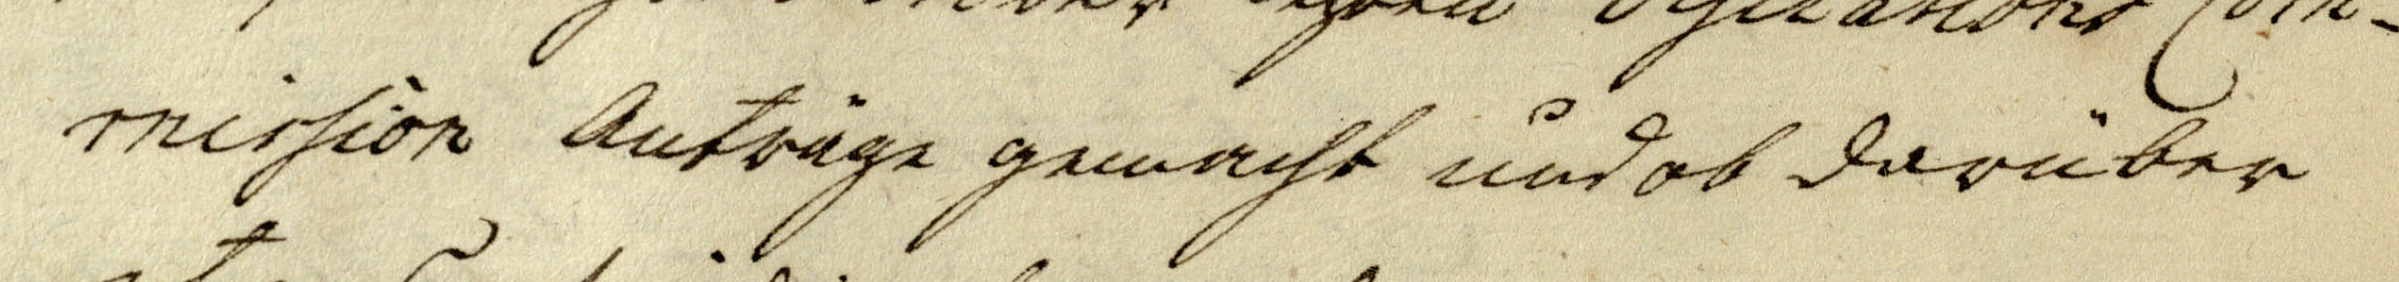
mission Anträge gemacht und ob darüber
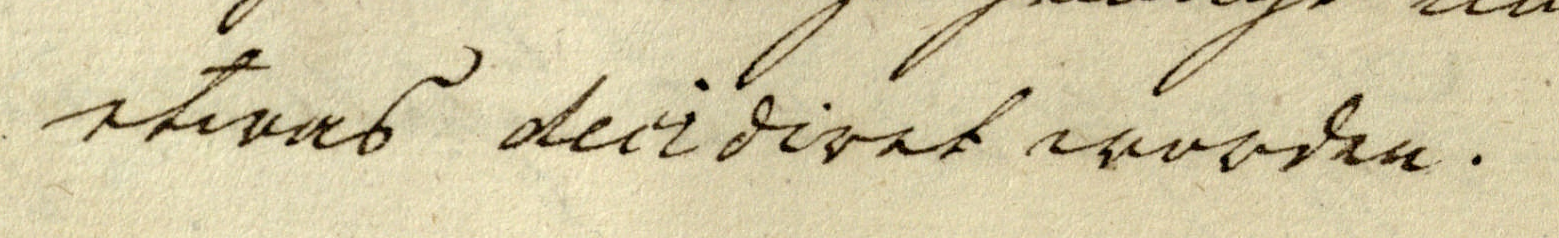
etwas decidiret worden.
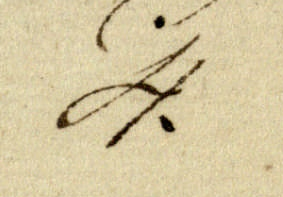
4.
